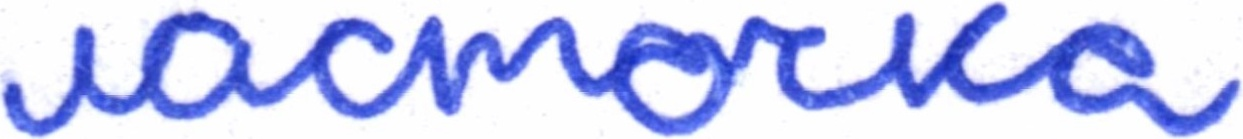ласточка
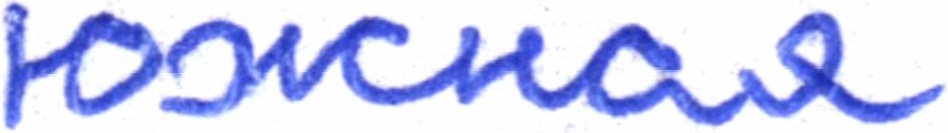южная
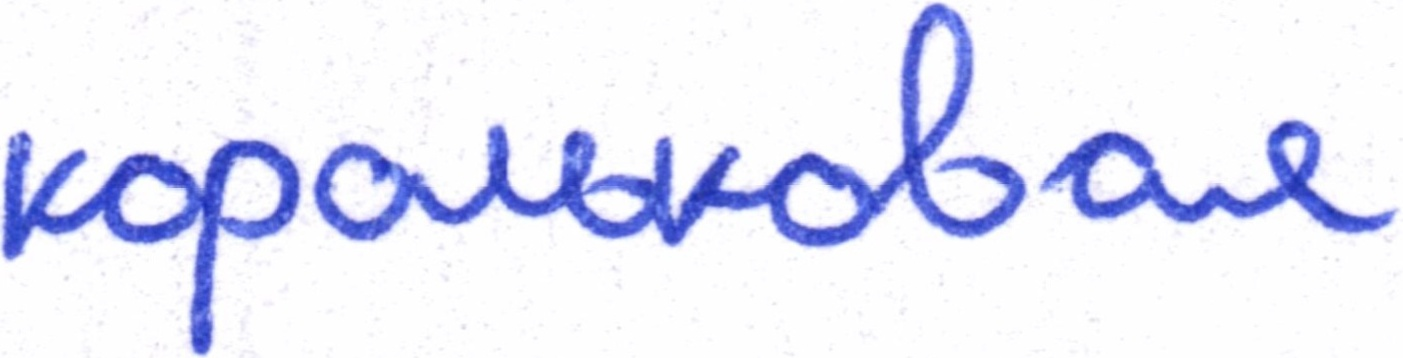корольковая
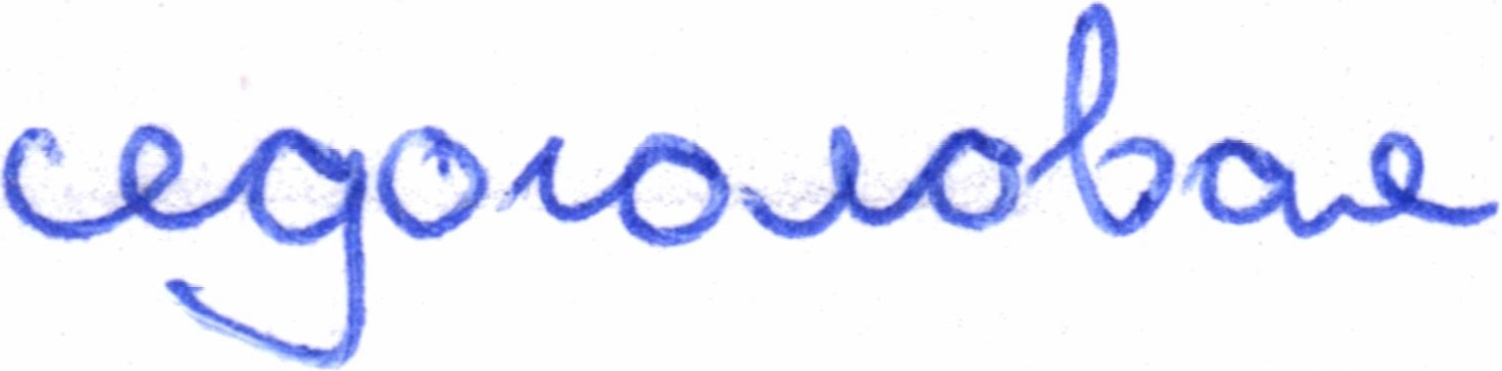седоголовая
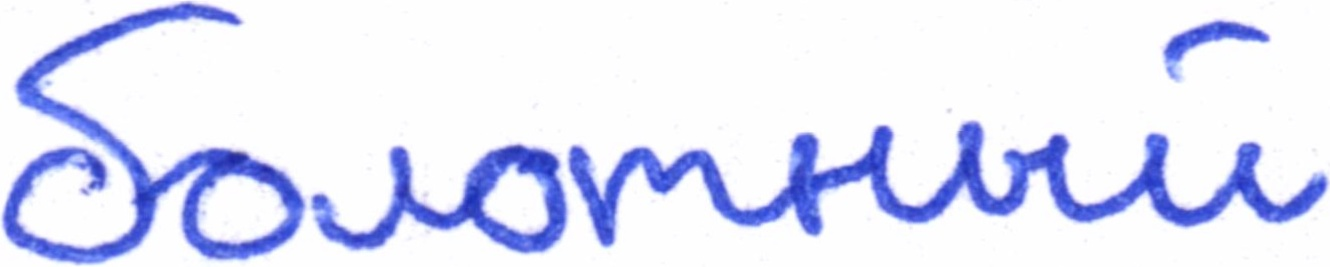болотный
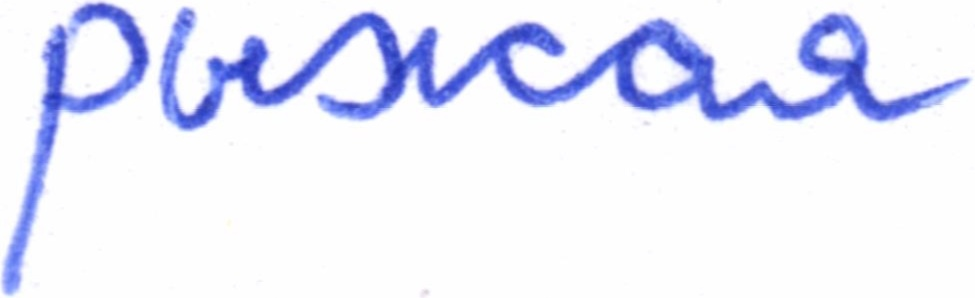рыжая
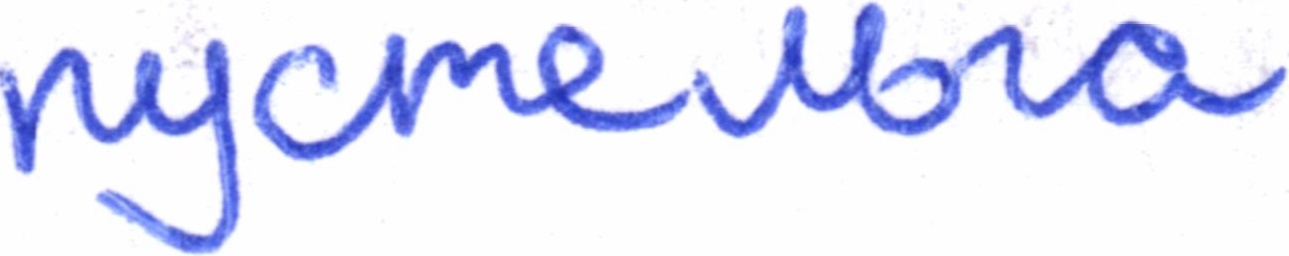пустельга
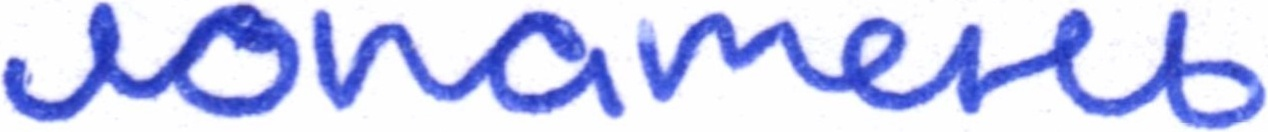лопатень
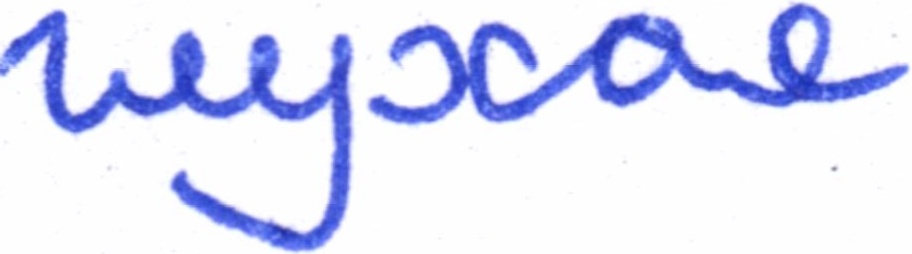глухая
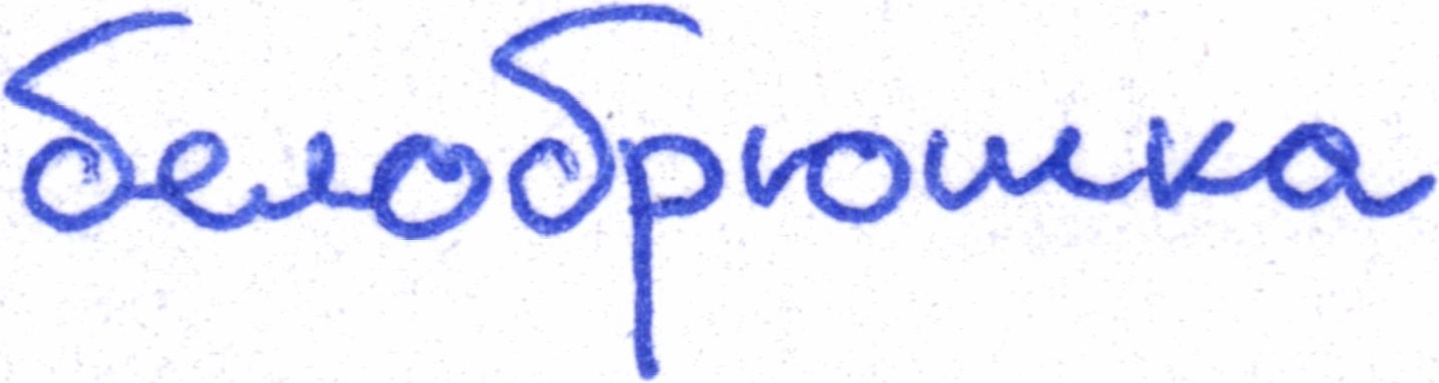белобрюшка
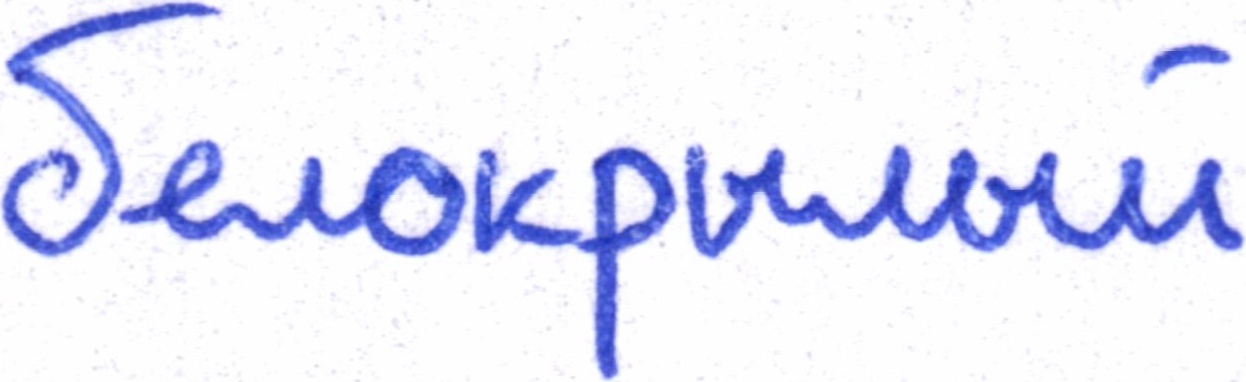белокрылый
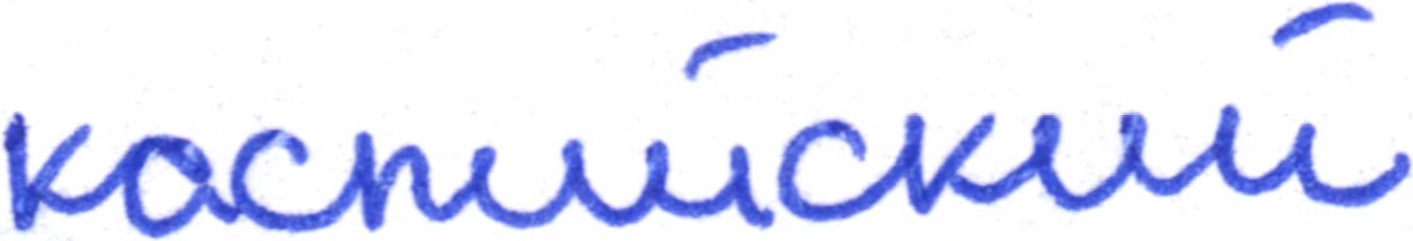каспийский
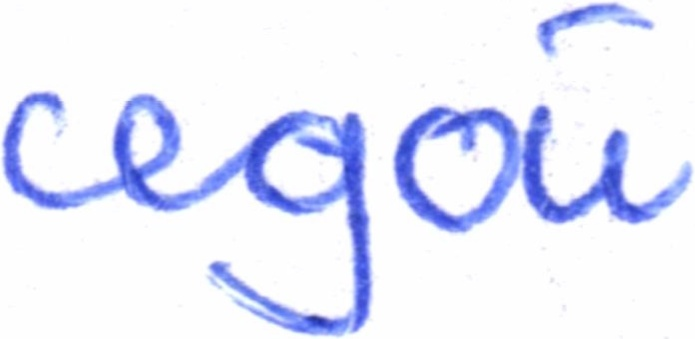седой
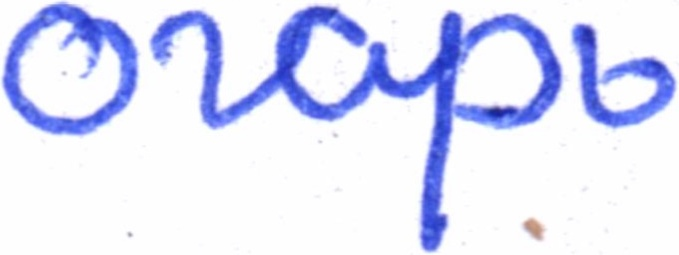огарь
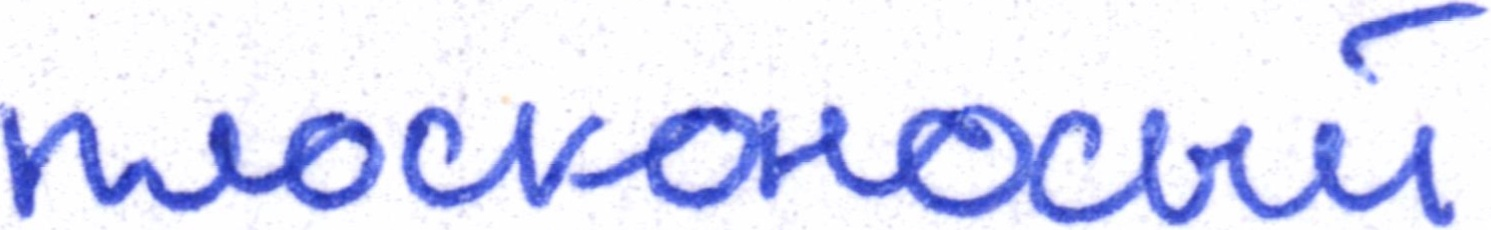плосконосый
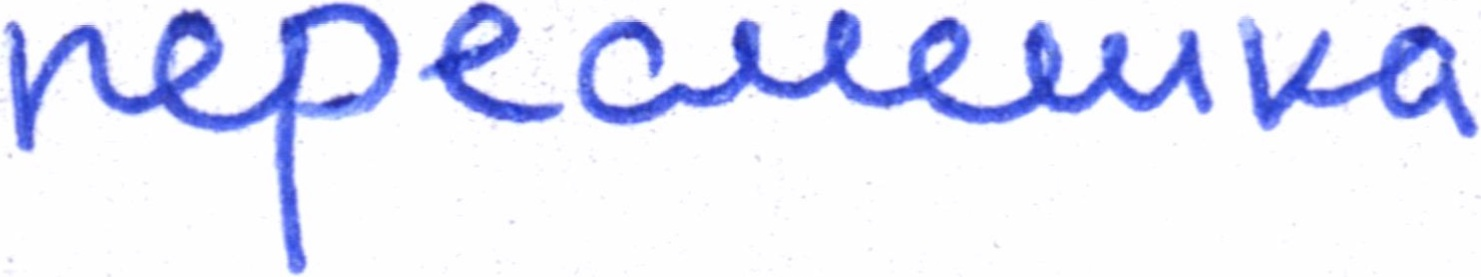пересмешка
